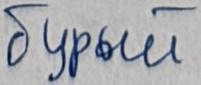бурый
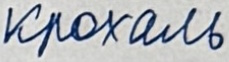крохаль
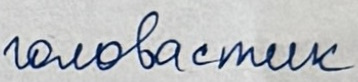головастик
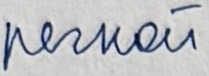речной
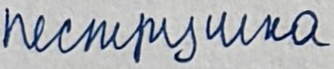пеструшка
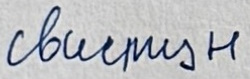свистун
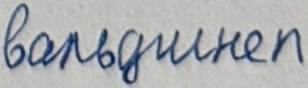вальдшнеп
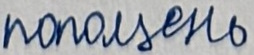поползень
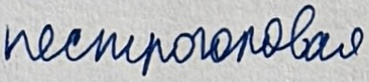пестроголовая
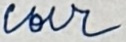сыч
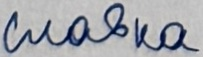славка
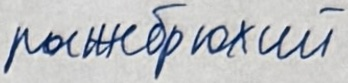рыжебрюхий
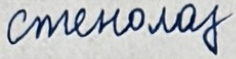стенолаз
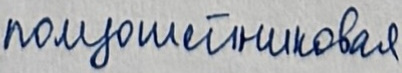полуошейниковая
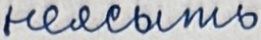неясыть
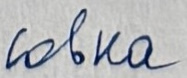совка
